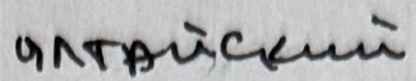алтайский
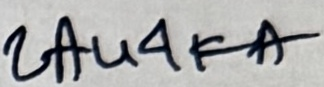гаичка
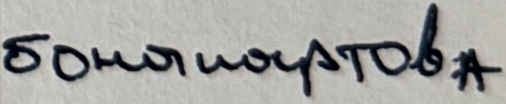бонапартова
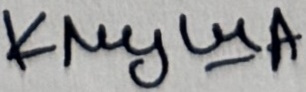клуша
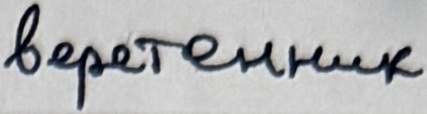веретенник
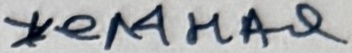желчная
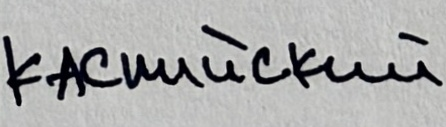каспийский
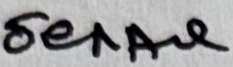белая
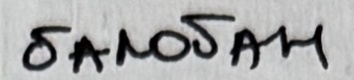балобан
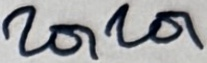гага
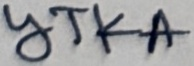утка
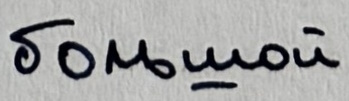большой
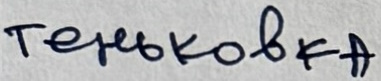теньковка
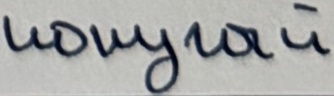попугай
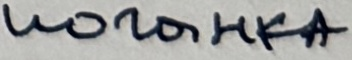поганка
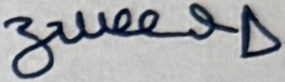змееяд
